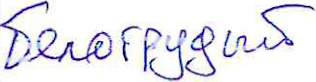белогрудый
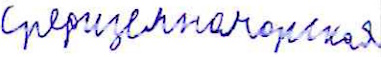средиземноморская
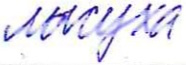лысуха
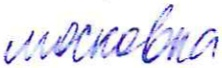московка
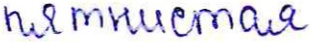пятнистая
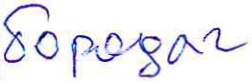бородач
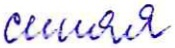синяя
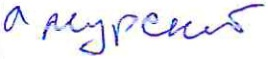амурский
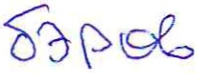бэров
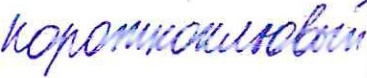короткоклювый
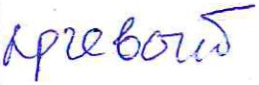арчевый
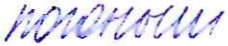погоныш
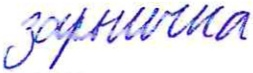зарничка
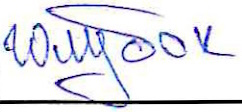голубок
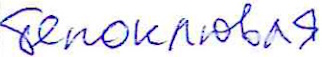белоклювая
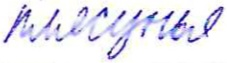плясунья
